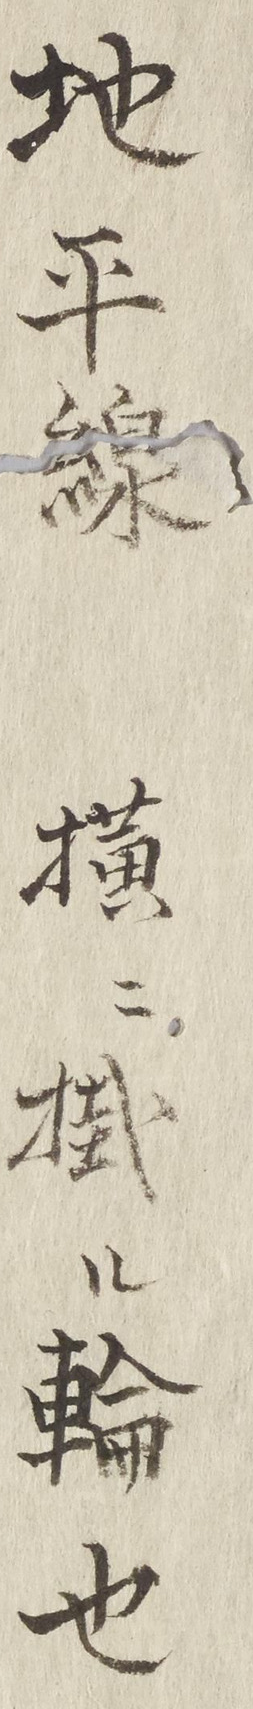地平線横ニ掛ル輪也
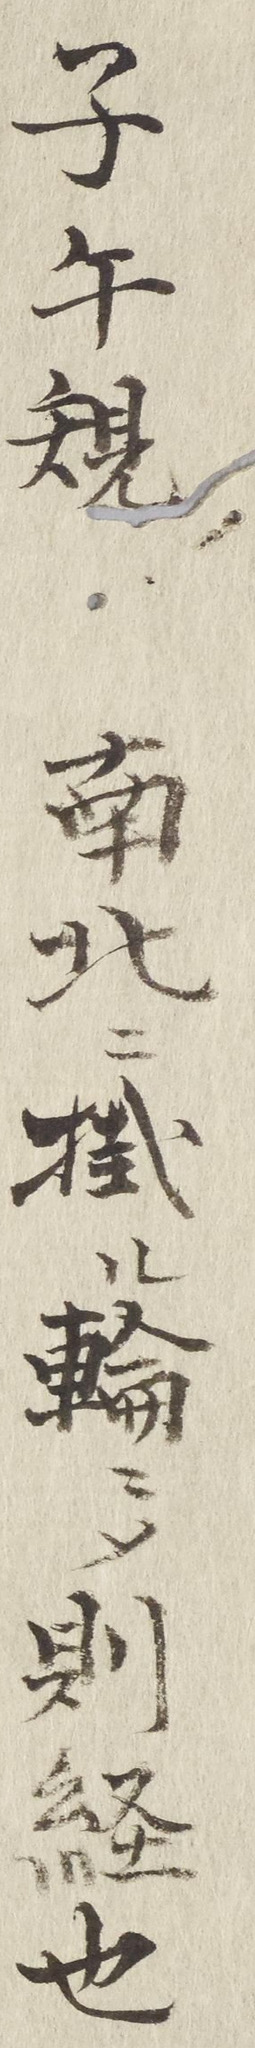子午規南北ニ掛ル輪ニシテ則経也
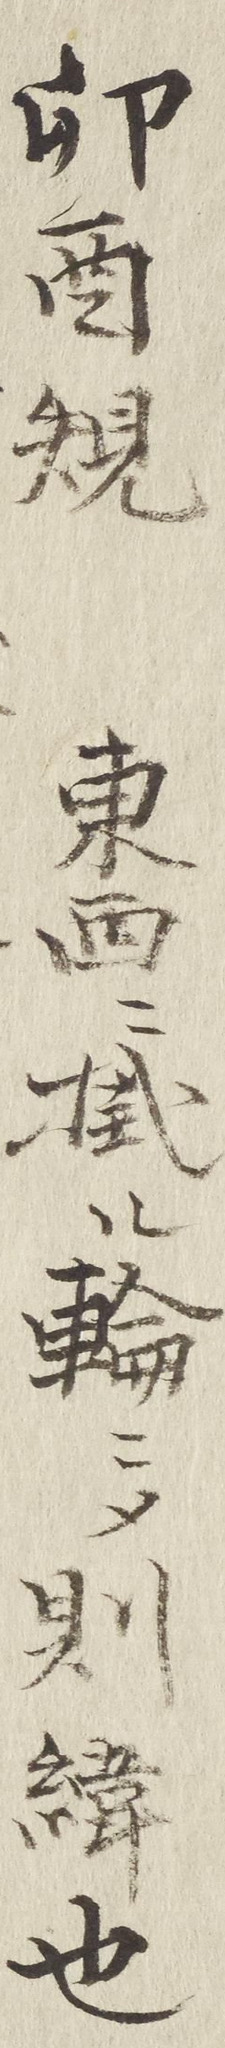卯酉規東西ニ掛ル輪ニシテ則緯也
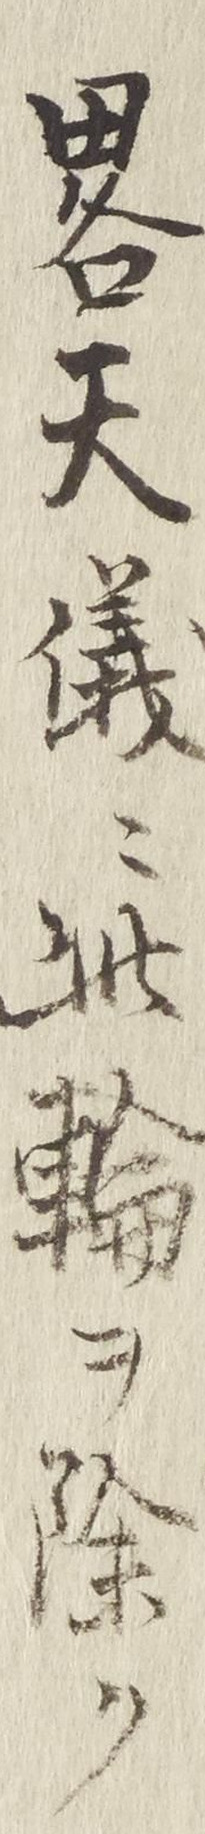略天儀ニ此輪ヲ除ク
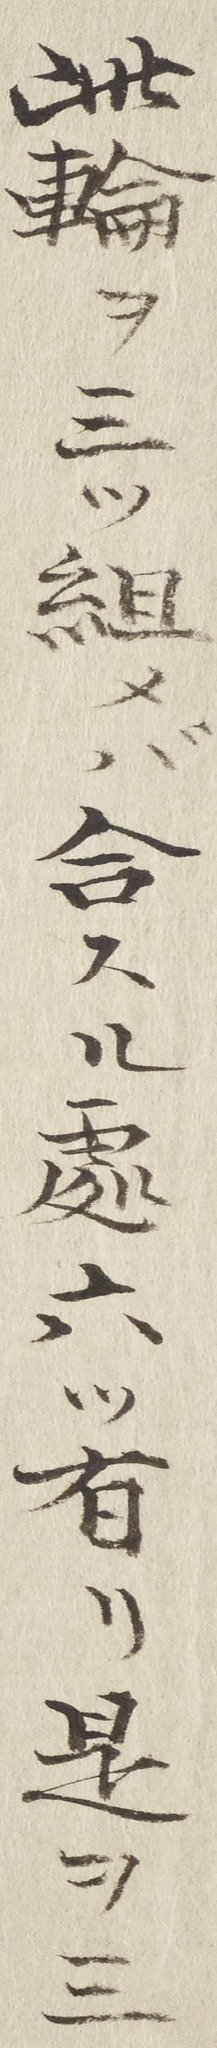此輪ヲ三ツ組メバ合スル処六ツ有リ是ヲ三
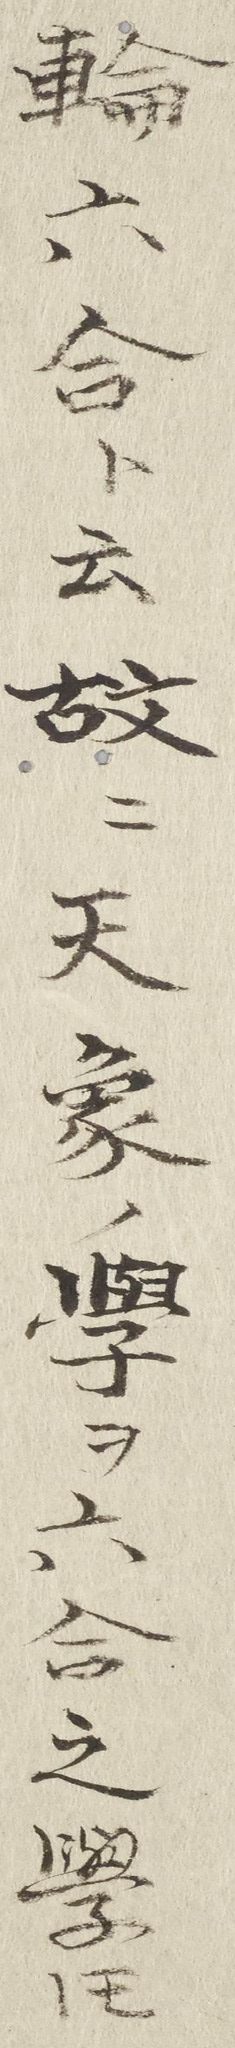輪六合ト云故ニ天象ノ学ヲ六合之学トモ
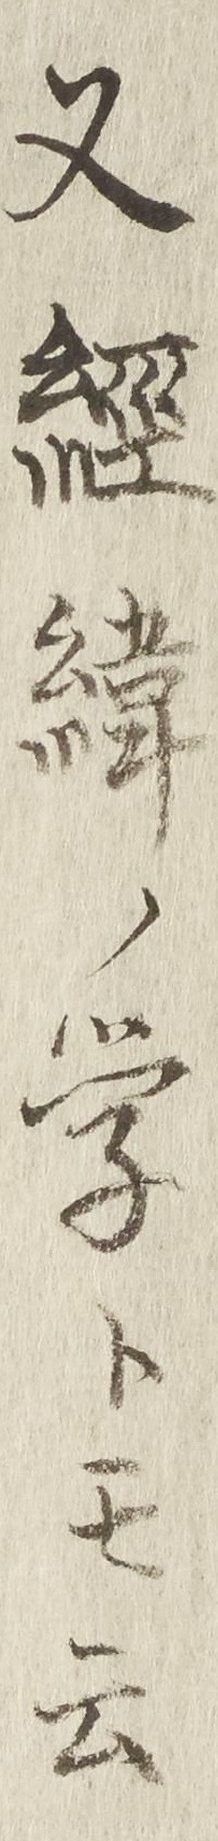又経緯ノ学トモ云
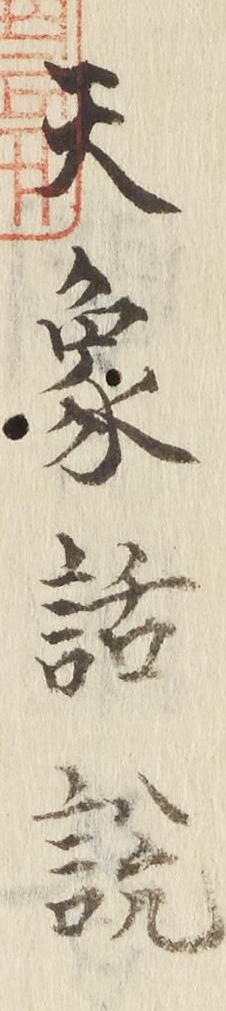天象話説
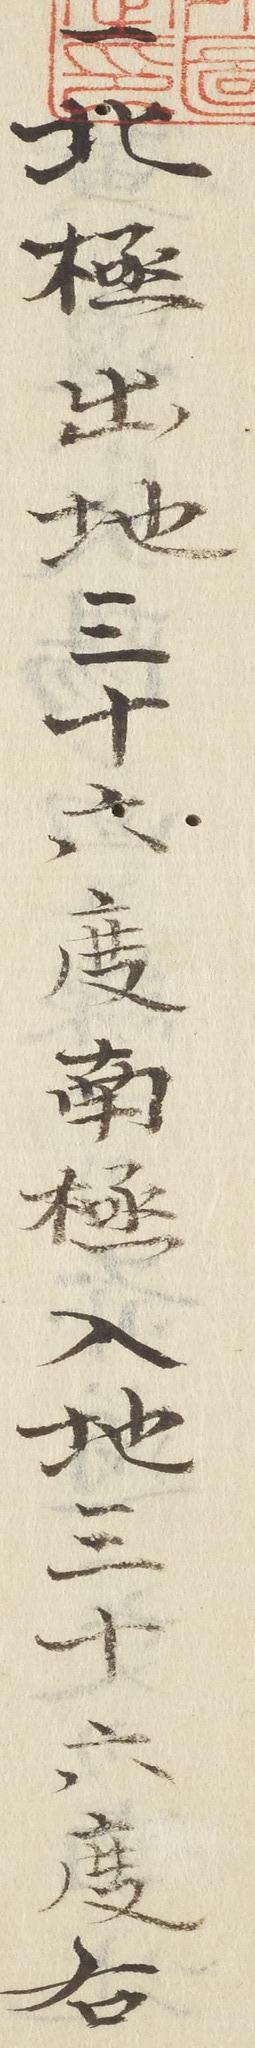一北極出地三十六度南極入地三十六度右
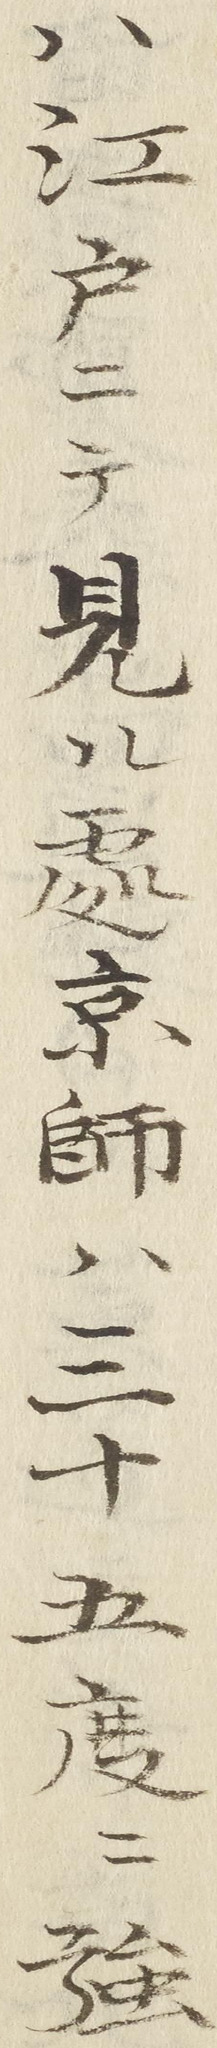ハ江戸ニテ見ル処京師ハ三十五度ニ強
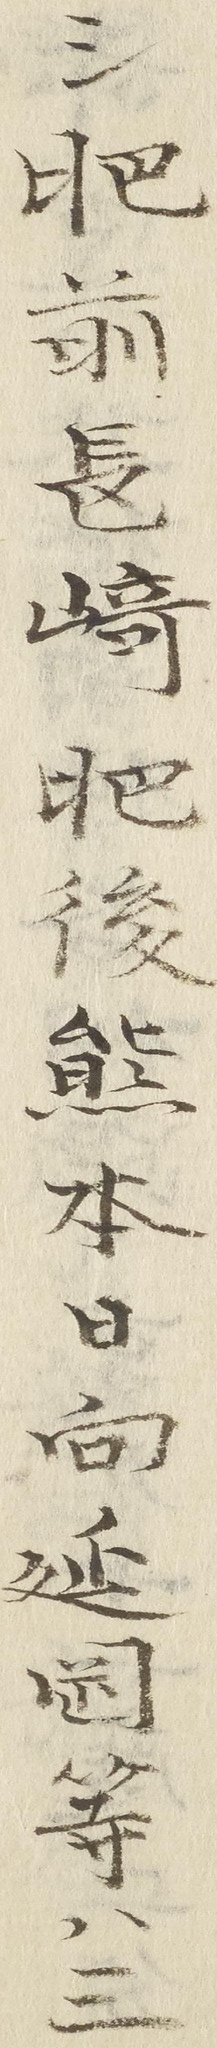シ肥前長崎肥後熊本日向延岡等ハ三
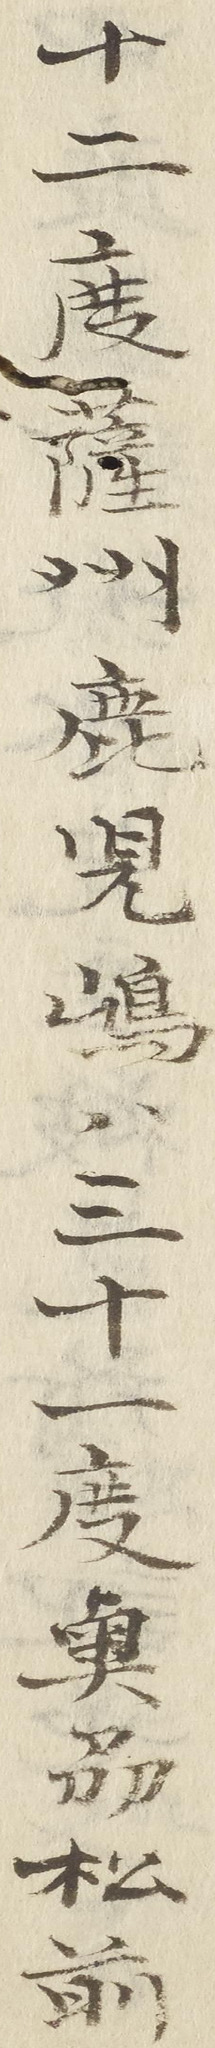十二度薩州鹿児島ハ三十一度奥州松前
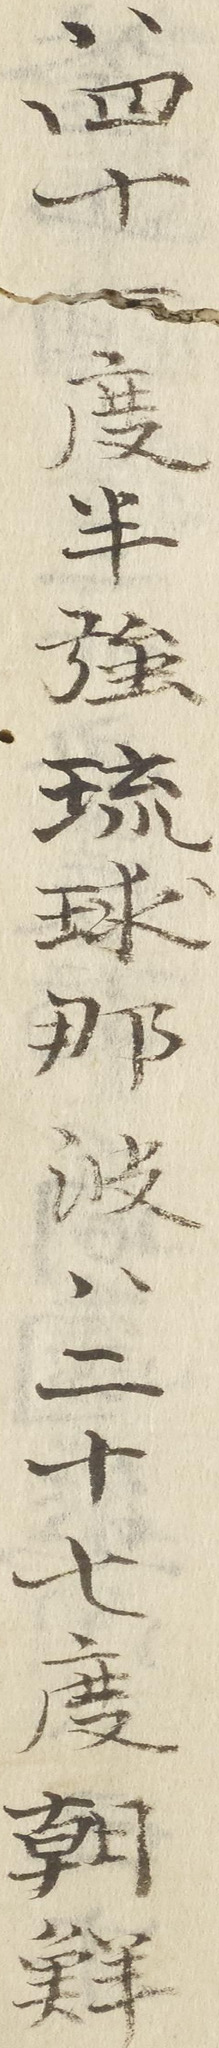ハ四十一度半強琉球那波ハ二十七度朝鮮

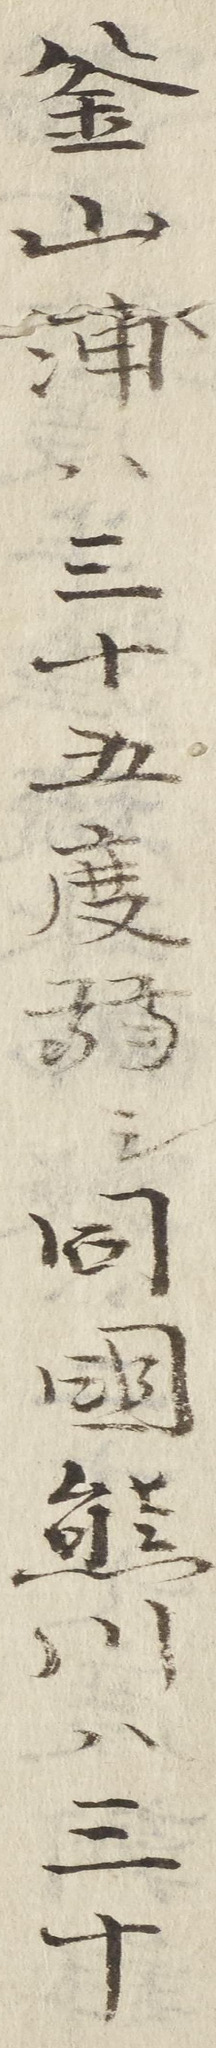釜山浦ハ三十五度弱シ同国熊川ハ三十
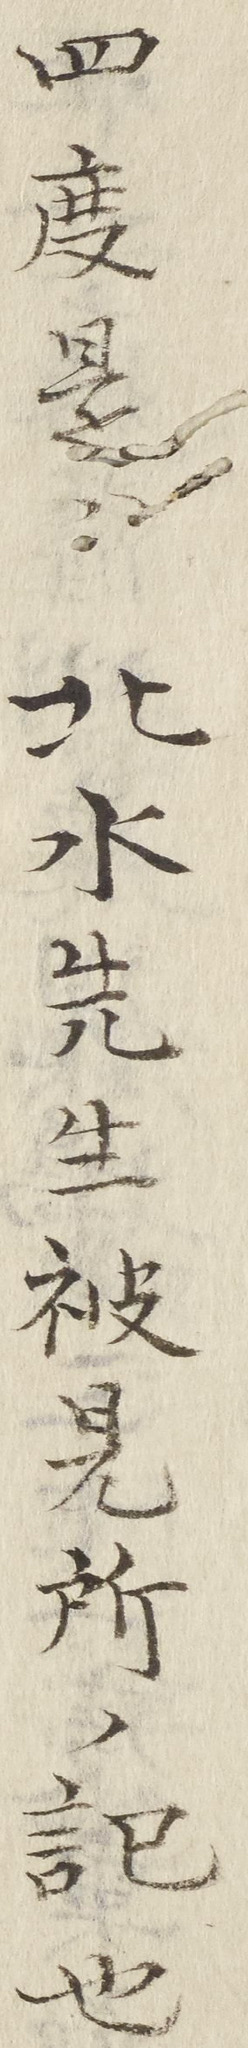四度是ハ北水先生被見所ノ記也
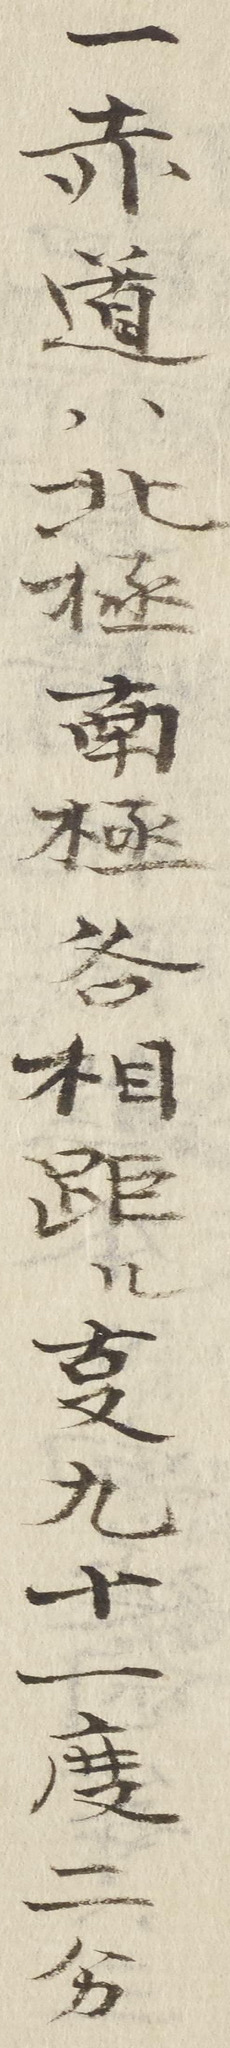一赤道ハ北極南極各相距ル事九十一度二分
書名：天象話説
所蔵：東京大学地震研究所図書室 Earthquake Research Institute Library, The University of Tokyo, JAPAN
